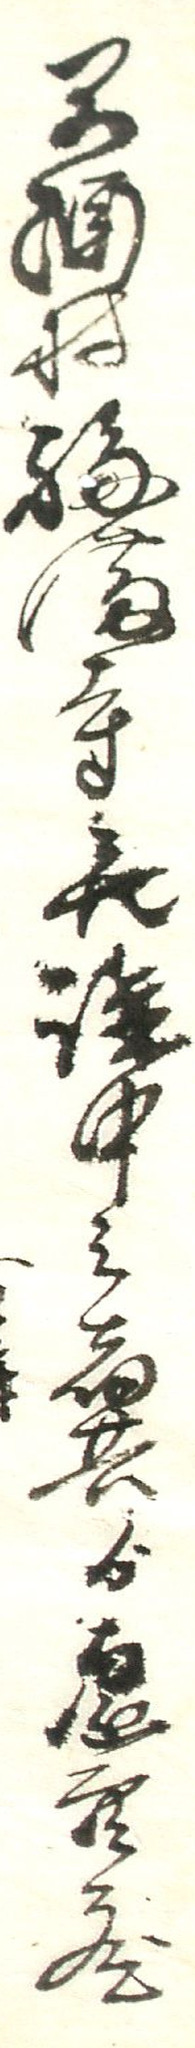早渕村福満寺幷講中之者共ゟ虚空蔵
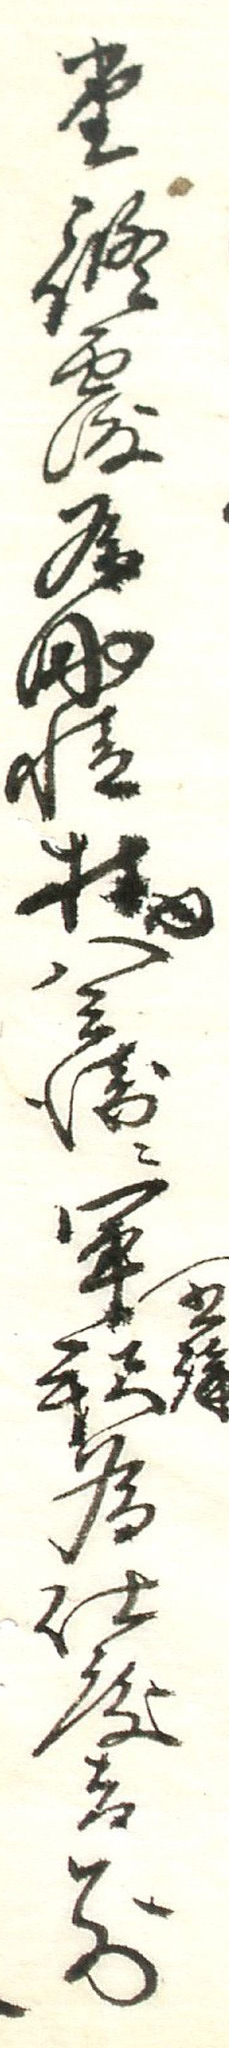堂修覆為助情村内八兵衛ニ軍書講釈為仕度旨別
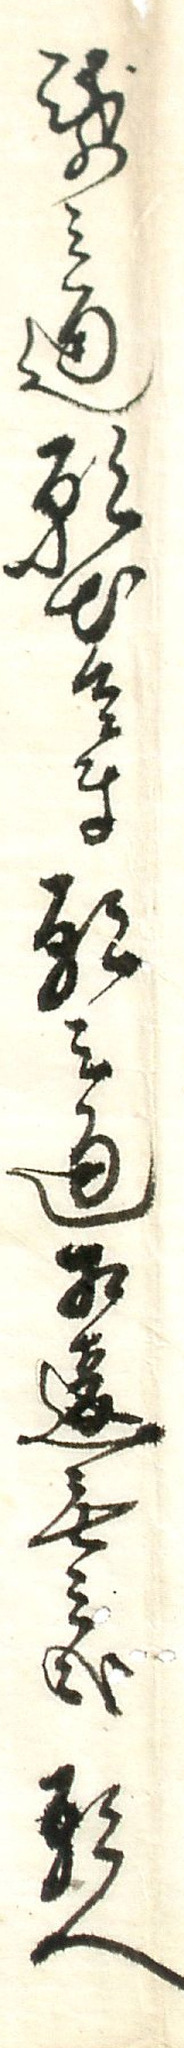帋之通願出候ニ付願之通相違無之哉願人
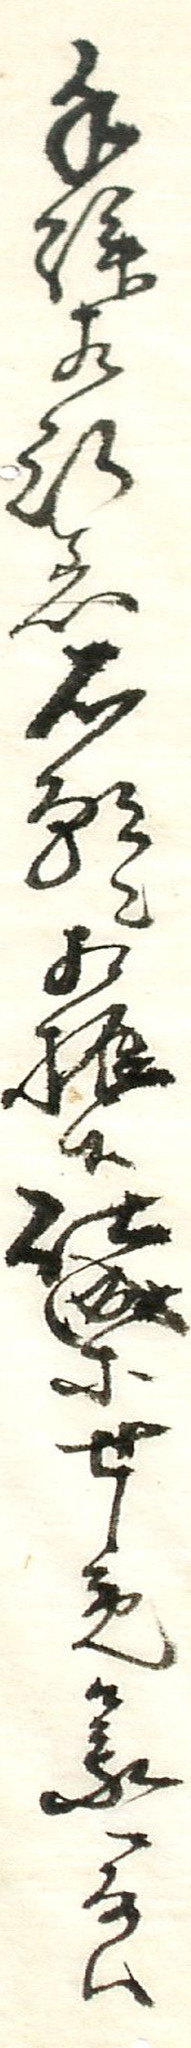手許相行着右願ニ相振候仕成等せしめ候義ニ而ハ
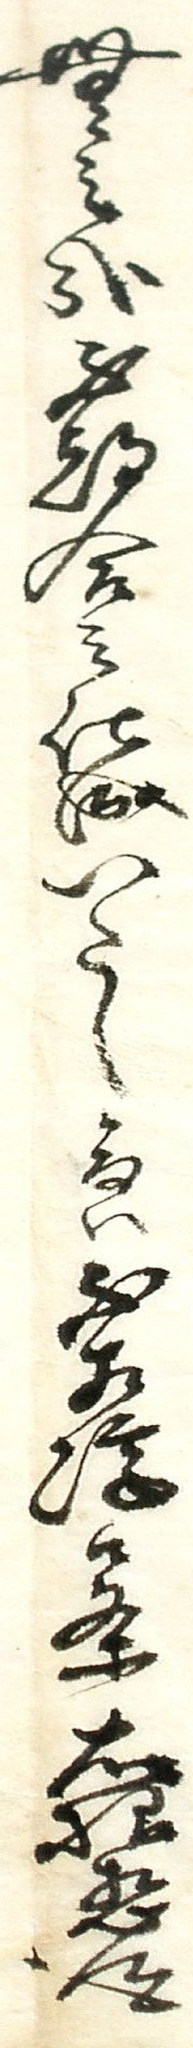無之哉不都合之仕成いたし候而ハ不相済候条右様相心得
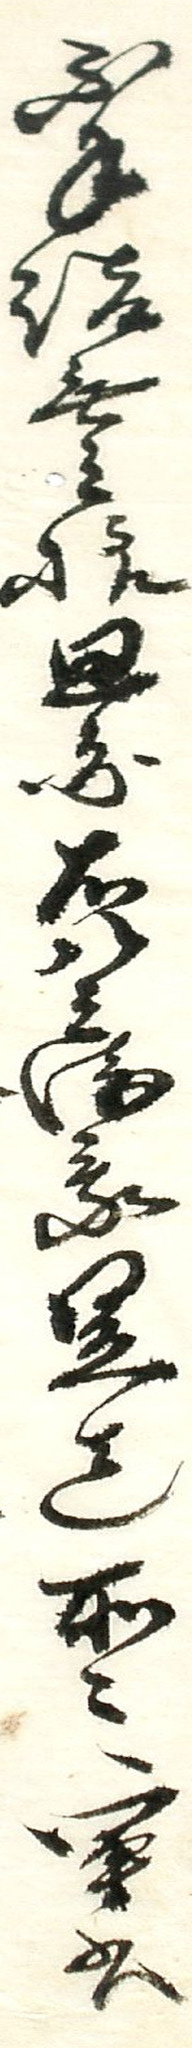不手詰無之様且亦右八兵衛義是迄所々へ軍書
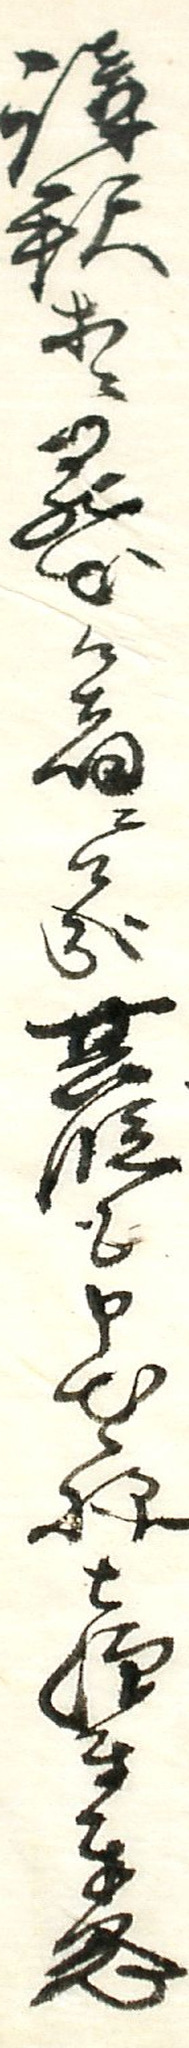講釈等ニ罷出候者ニ候哉其段も申出候様被仰付奉畏
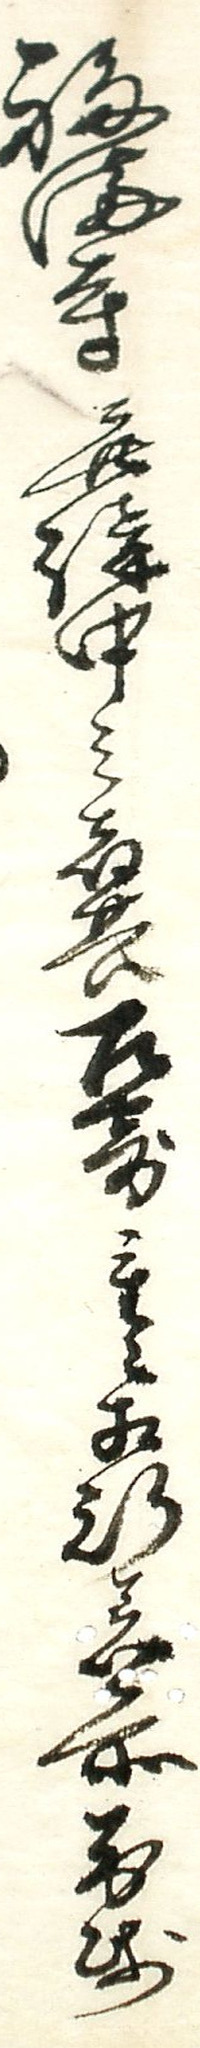福満寺幷講中之者共召寄重々相行着候所別帋
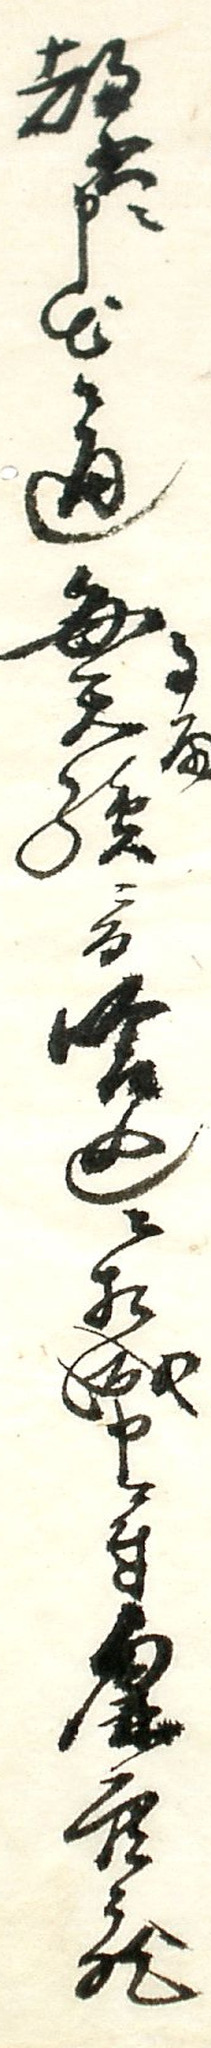都書ニ申出候通毎時雨天續ニ而喰込ニ相成申ニ付虚空蔵
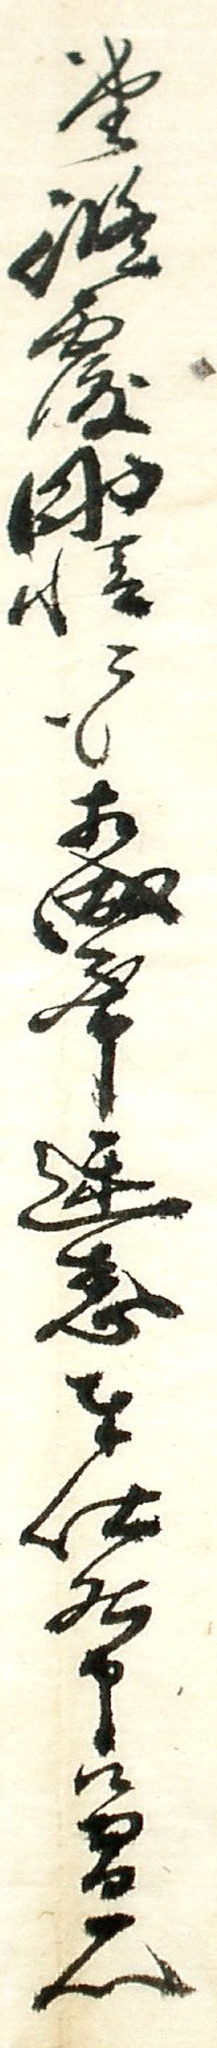堂修覆助情ニも相成不申迷惑迷惑奉仕居申候間右
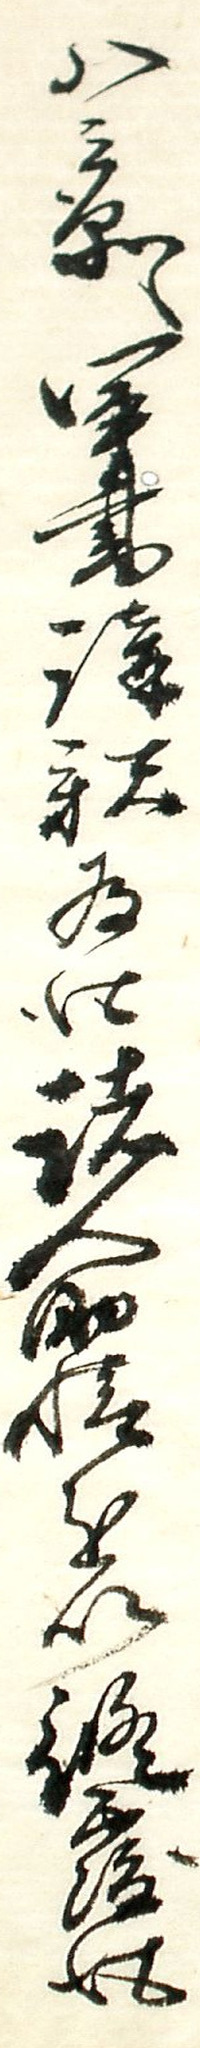八兵衛へ軍書講釈為仕諸人助情を以修覆仕
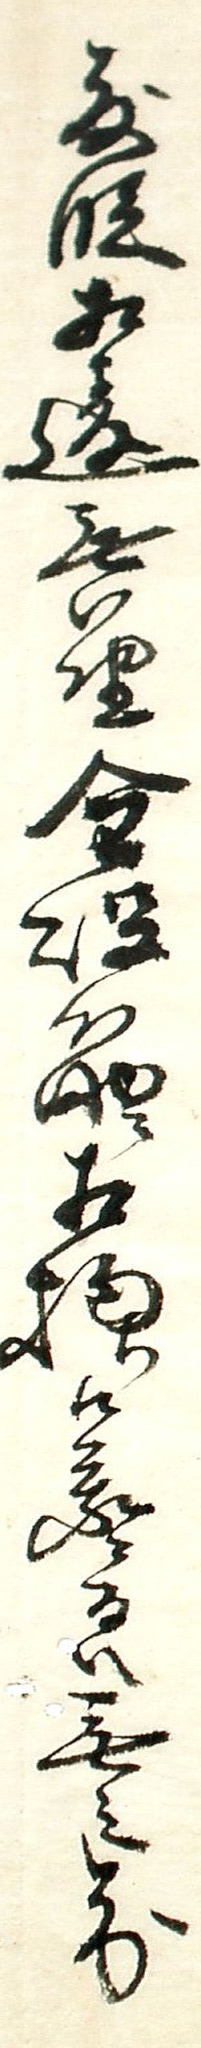度段相違無御坐全役筋ニ相拘り候義ニ而ハ無之別
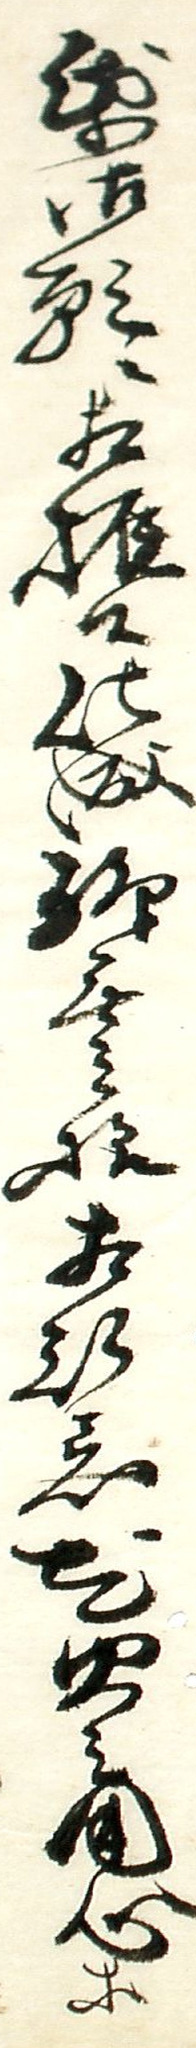帋御願ニ相振候仕成聊無之様相行着尤火之用心等
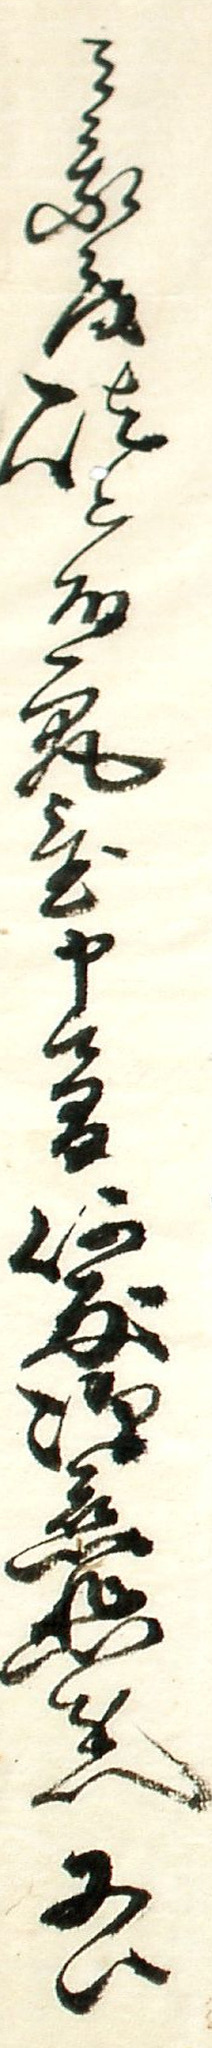之義も屹と取究置申候間何卒御慈悲を以右
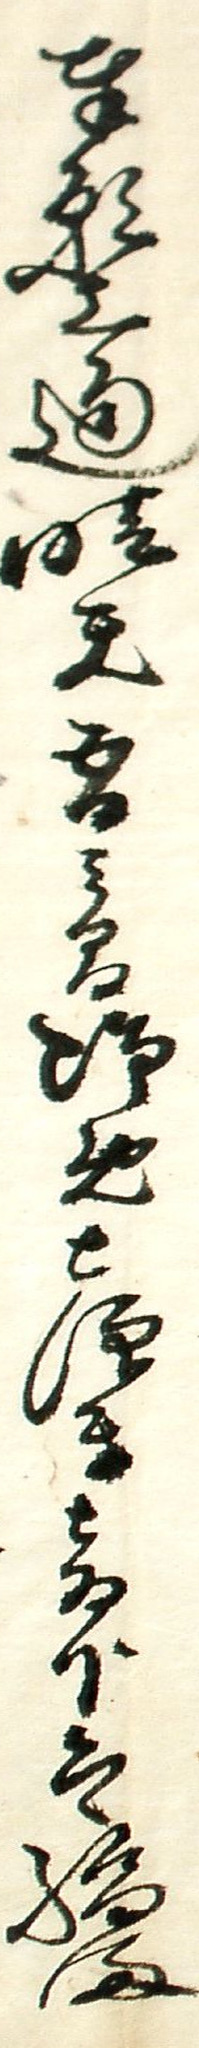奉願上通晴天五日之間御免被仰付被為下候ハヽ福満
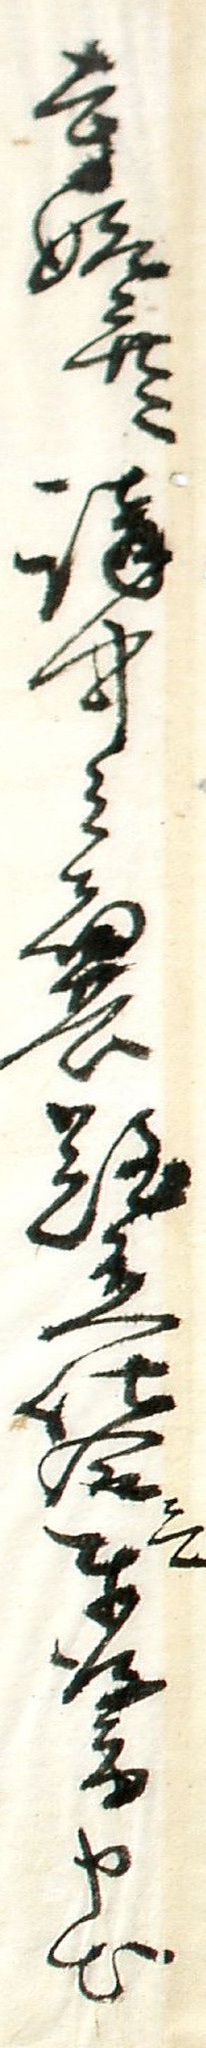寺始幷ニ講中之者共難有仕合ニ可奉存旨申出
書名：(早渕村福満寺子ども浄瑠璃願紙面）他
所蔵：鳴門教育大学 Naruto University of Education
